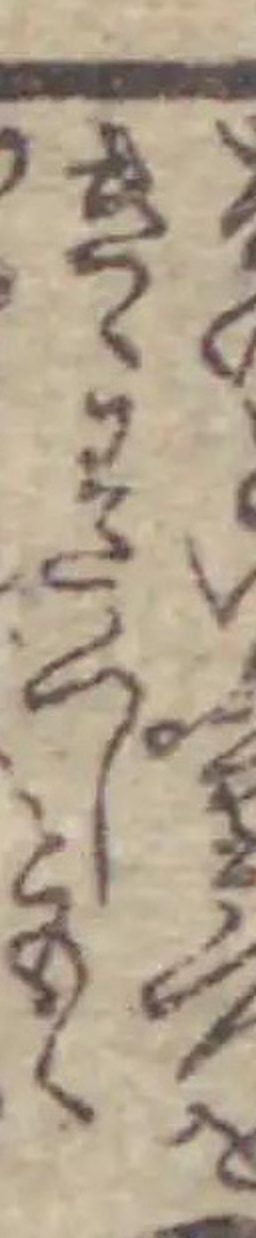きゝわたくしともゝ
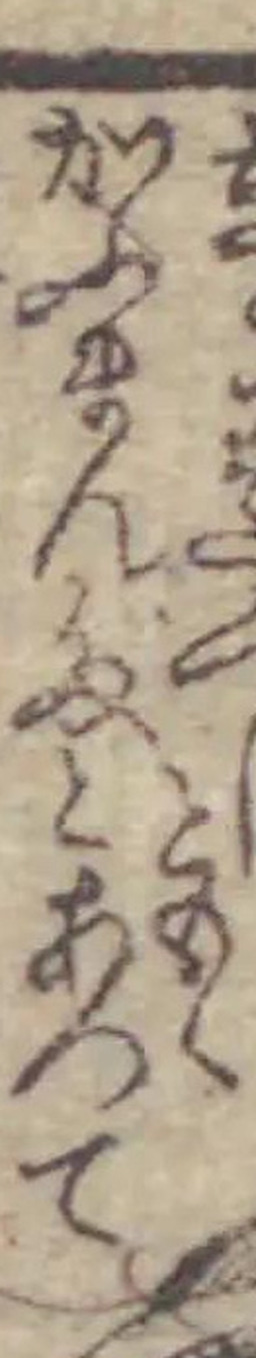かふまんだとあつて
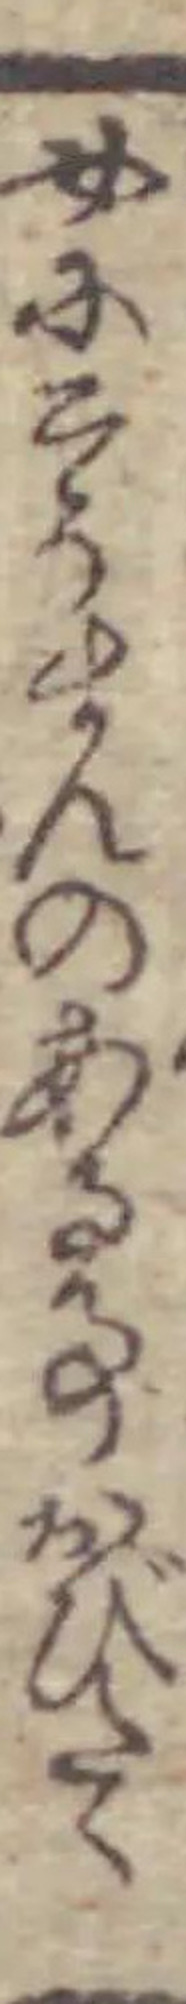女にこうまんのある事おびたゝ
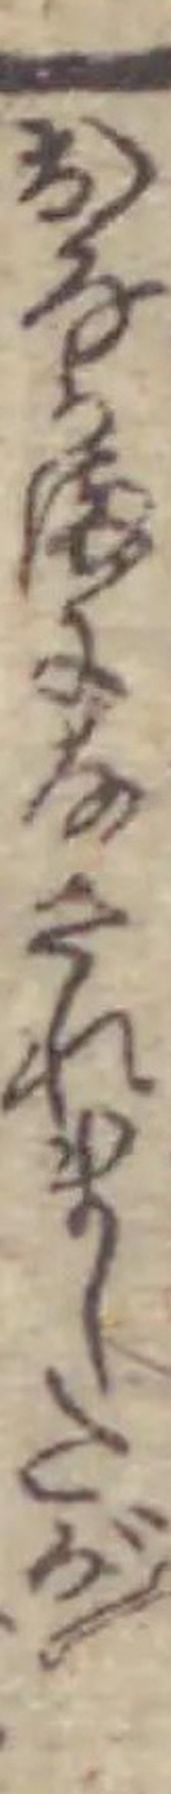おなかまになされましたが
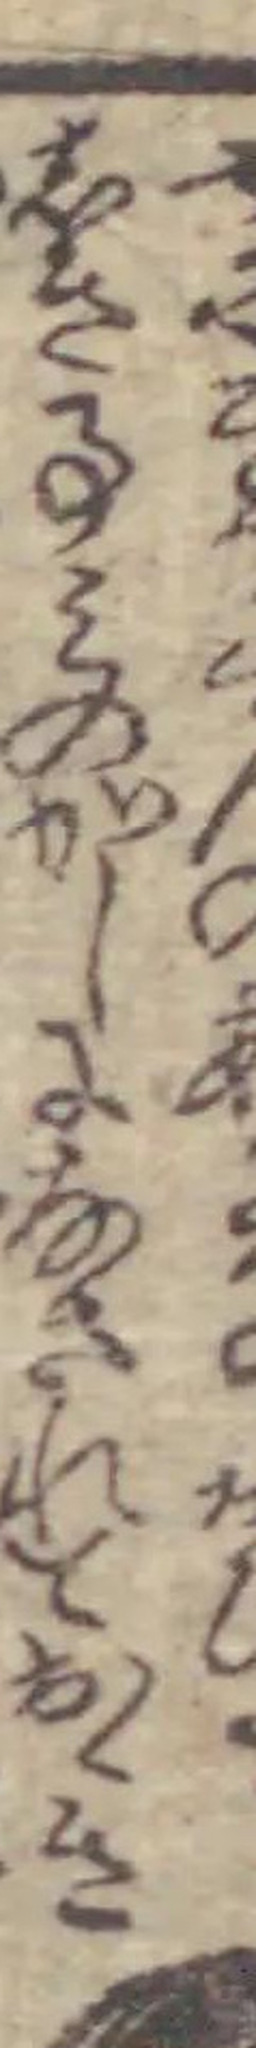しき事みのかしになされておゝき
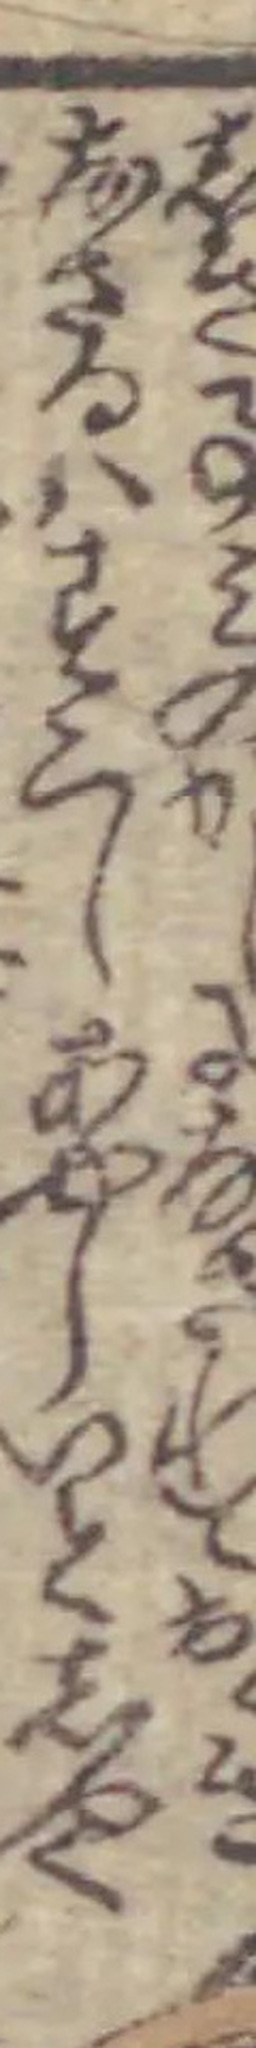なさるはすこしあやしいとしや
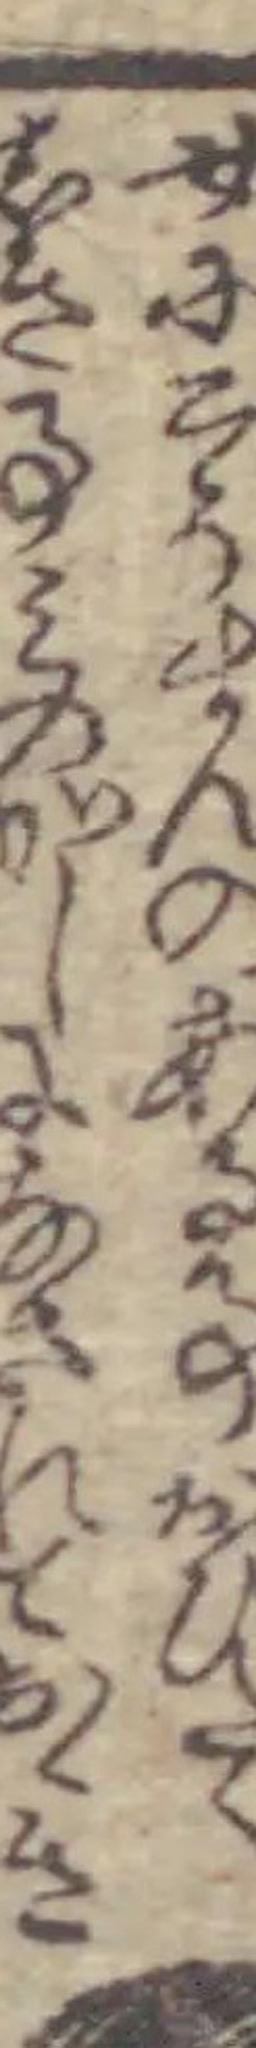しき事みのかしになされておゝき
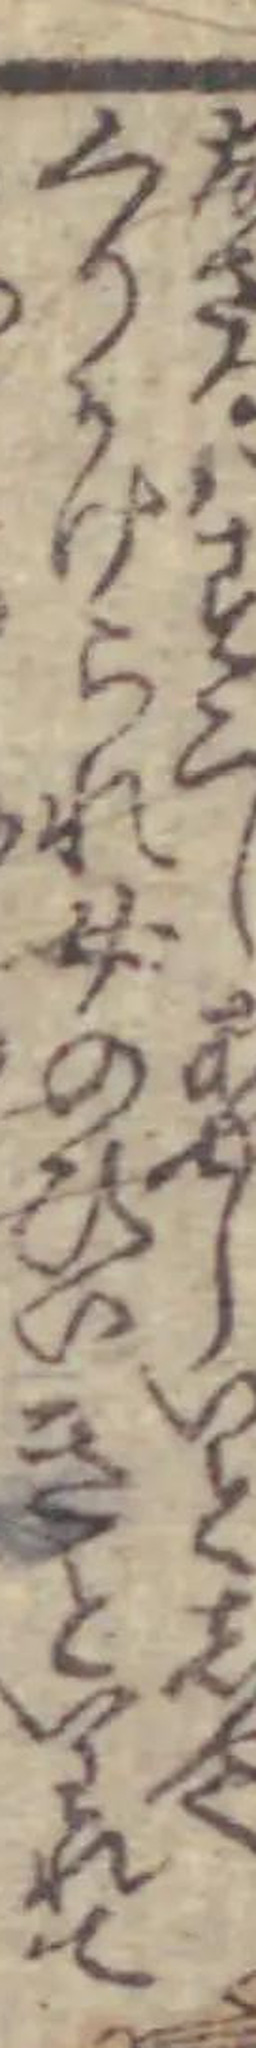くりかけられ女のひいきといわれて
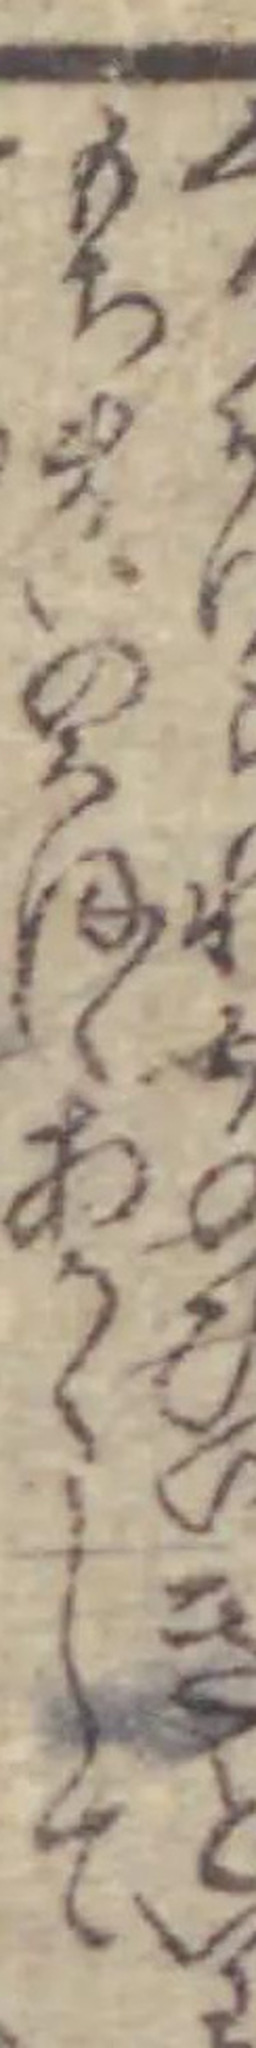もちまいのかほゝあかくして
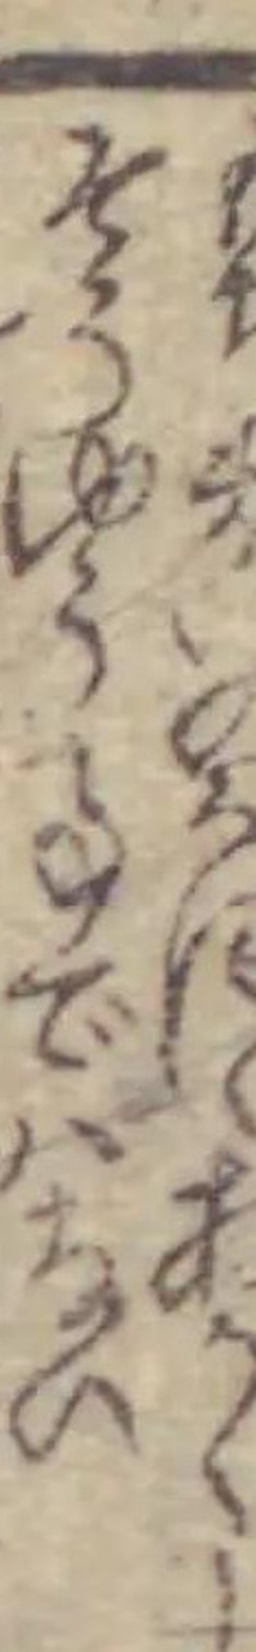そうゆう事ではない
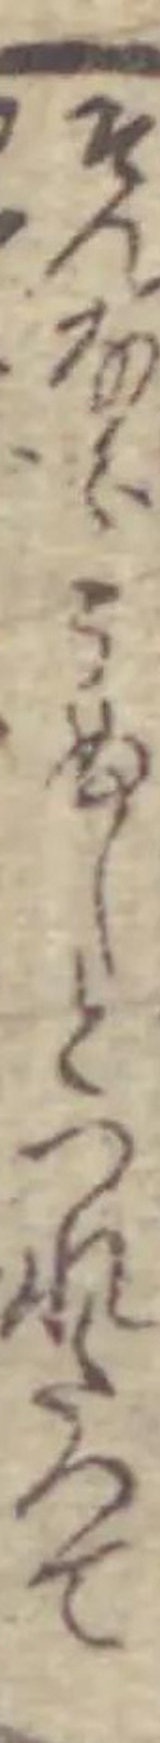そんならうぬしとつれたつて
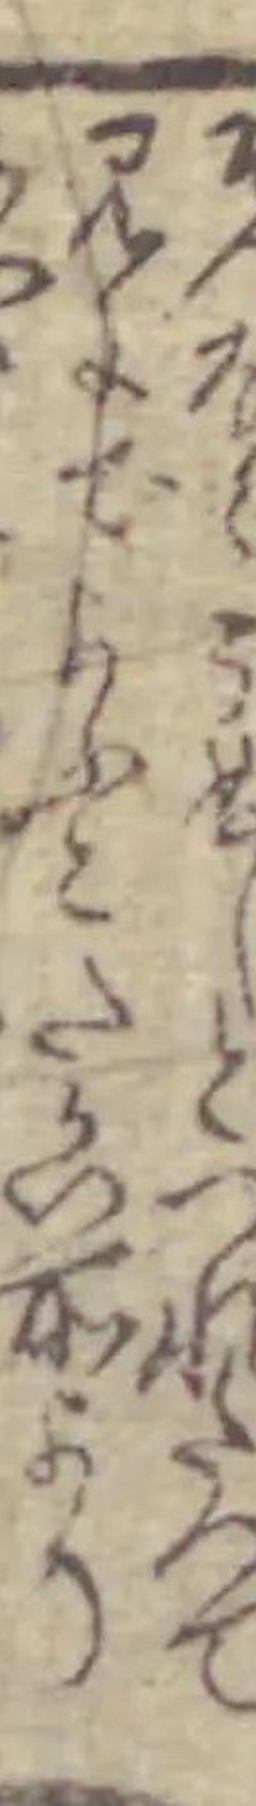見にでよふとたかい所より
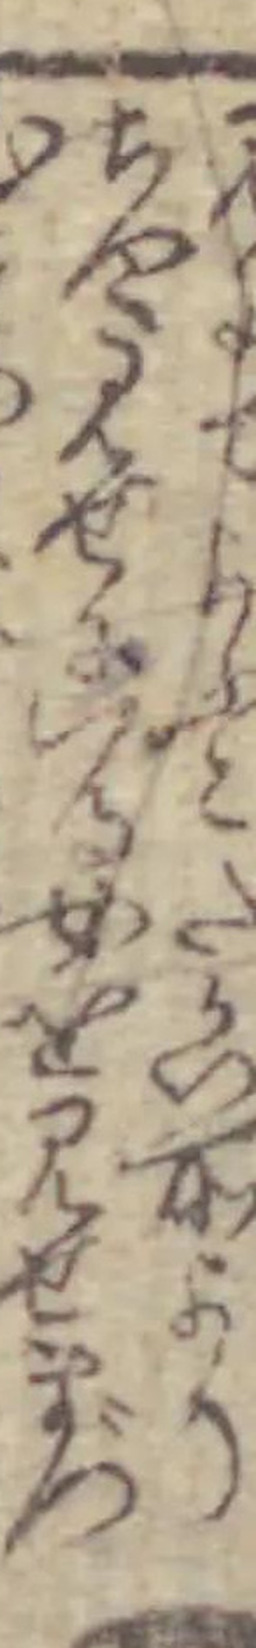ちや見せにいる女を見せまづ
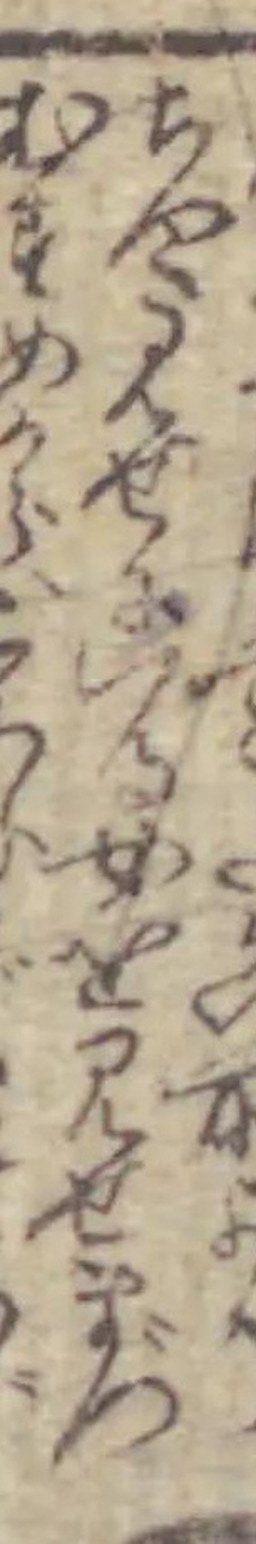ちや見せにいる女を見せまづ
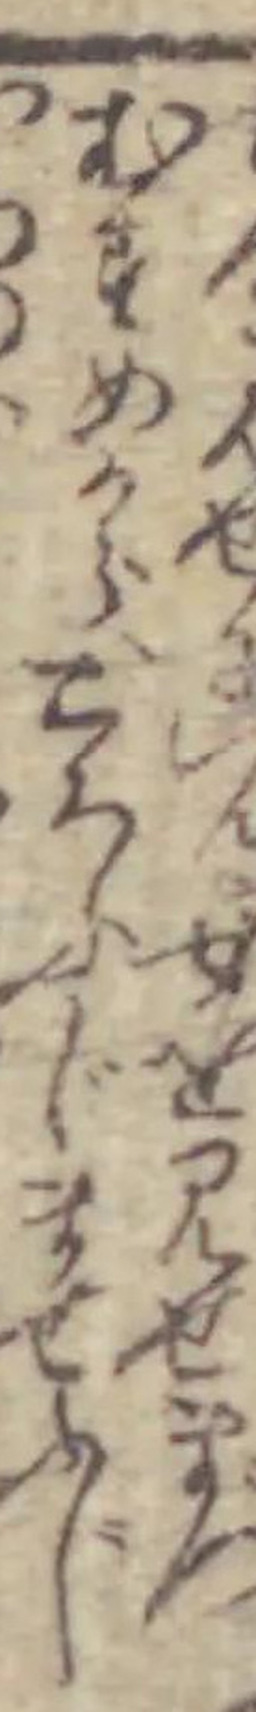むすめからころふじませふじ
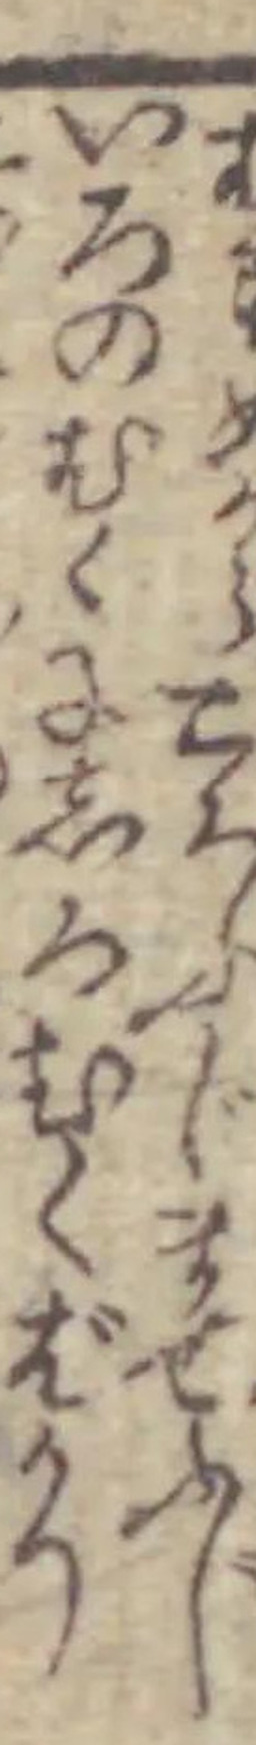いろのむくにしろむくばかり
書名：珍説女天狗 2巻
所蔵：国立国会図書館 National Diet Library, JAPAN
